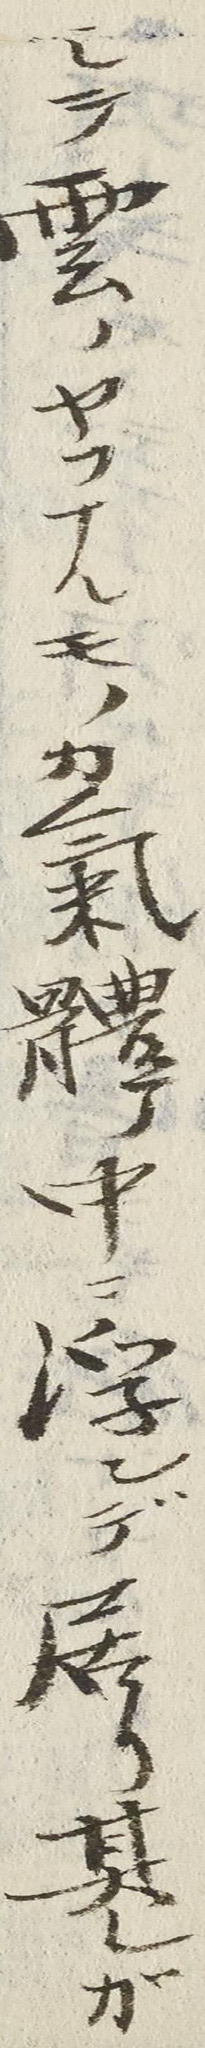シテ雲ノヤフナルモノか気体ノ中二浮ンデ居リ其レガ
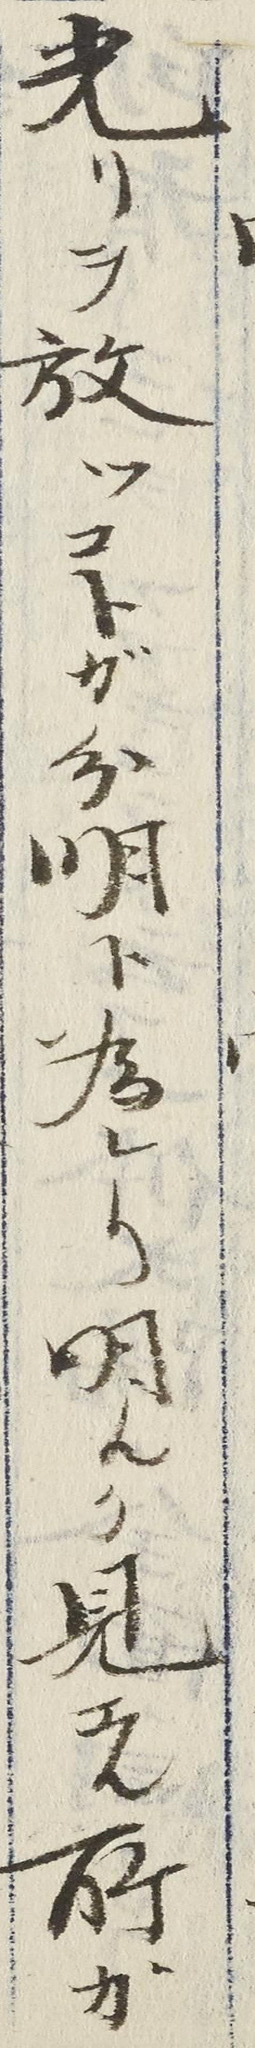光ヲ放ツコトガ分明ㇳ為レリ明ㇽク見エん所が
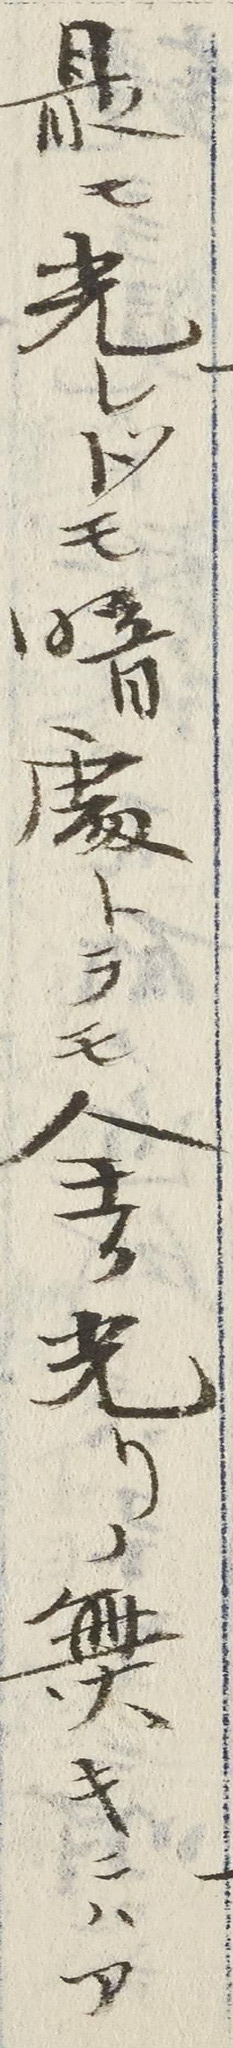最モ光レドモ暗処トテモ全ク光リノ無キ二ハア
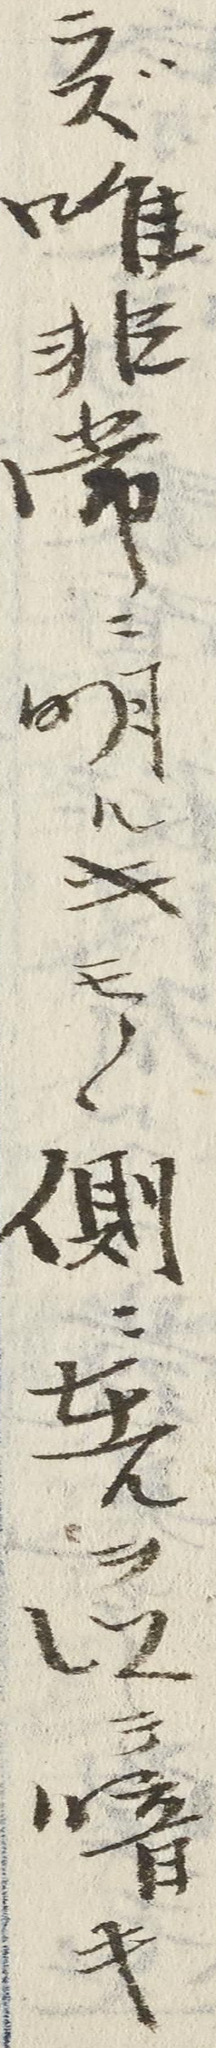ラズ唯非常二明ㇽキモノゝ側二在ヲ以テ暗キ
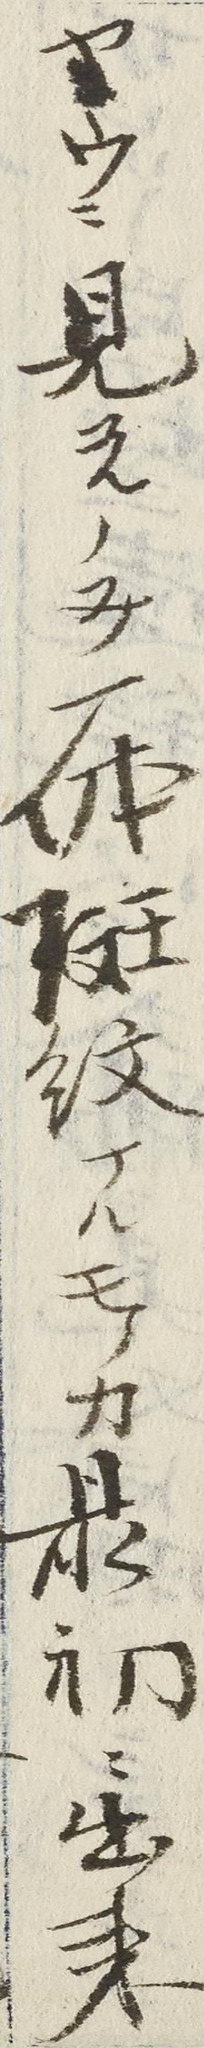ヤウ二見エンノみ一体斑紋ナルモノカ最初に出来
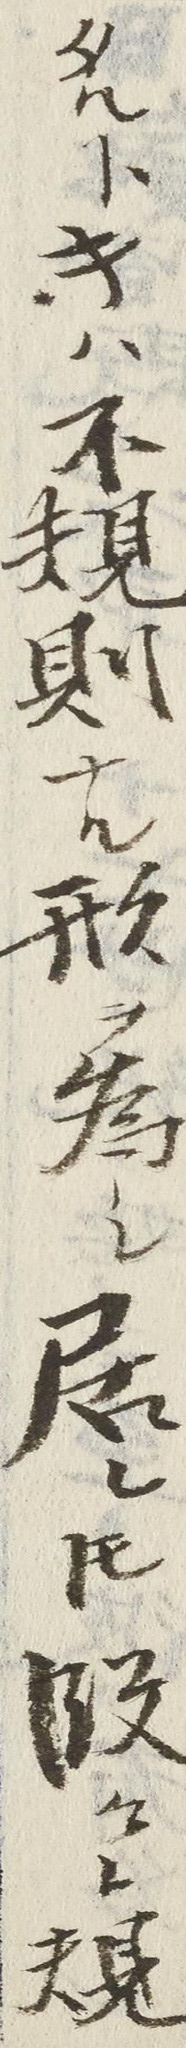タルㇳキハ不規則ナル形ヲ為し居レトモ段々二規
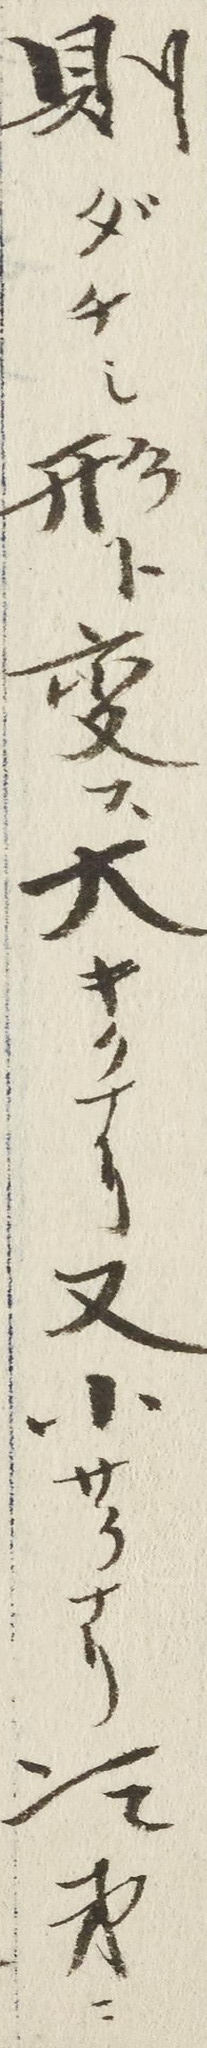則ダチし形ㇳ変ㇲ大キクナリ又小サクナリ次第二
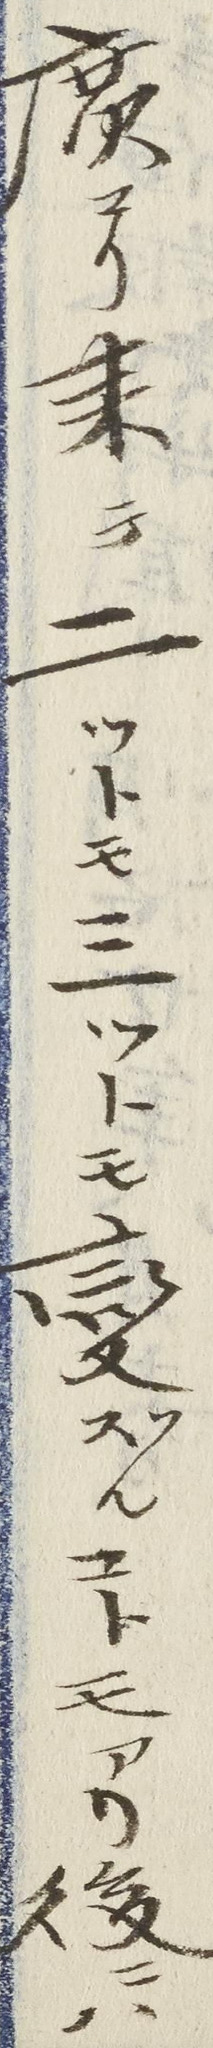廣マリ来テ二ツトモ三ツトモ変ズルコトモモアリ後二ハ
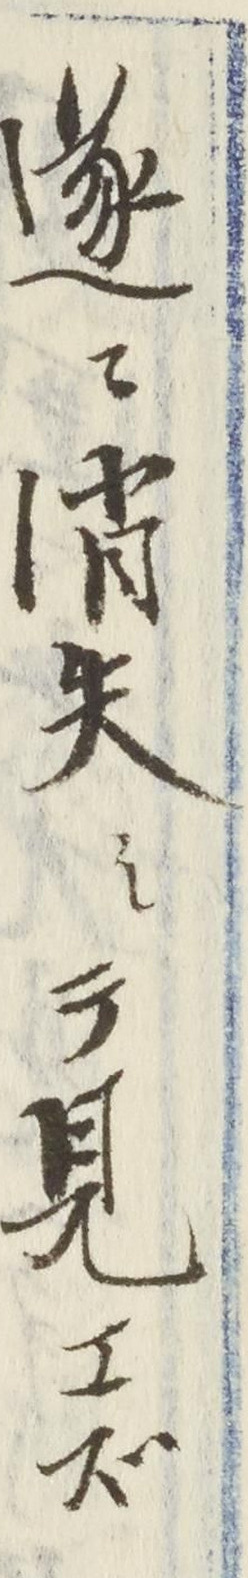遂二消失しテ見エズ
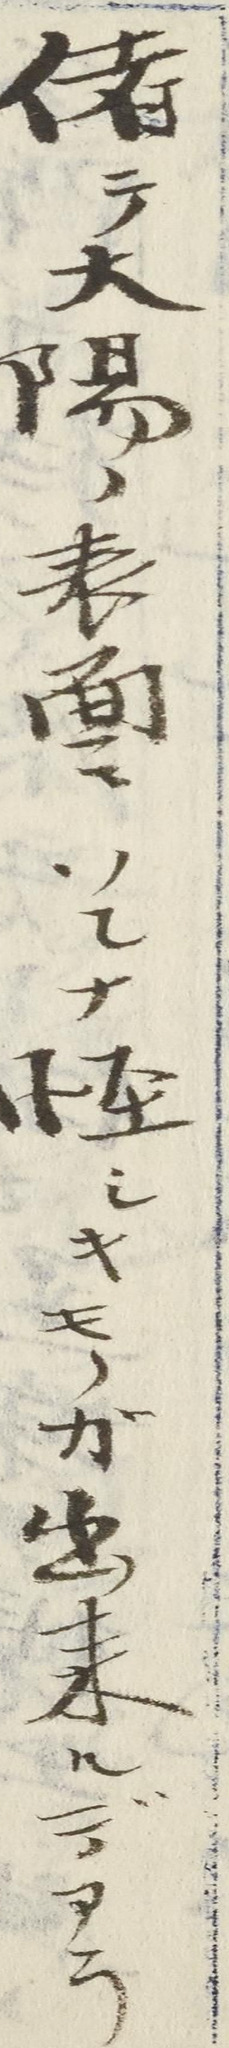偖テ太陽ノ表面二ハテナ怪シキモノガ出来ㇽデアラ
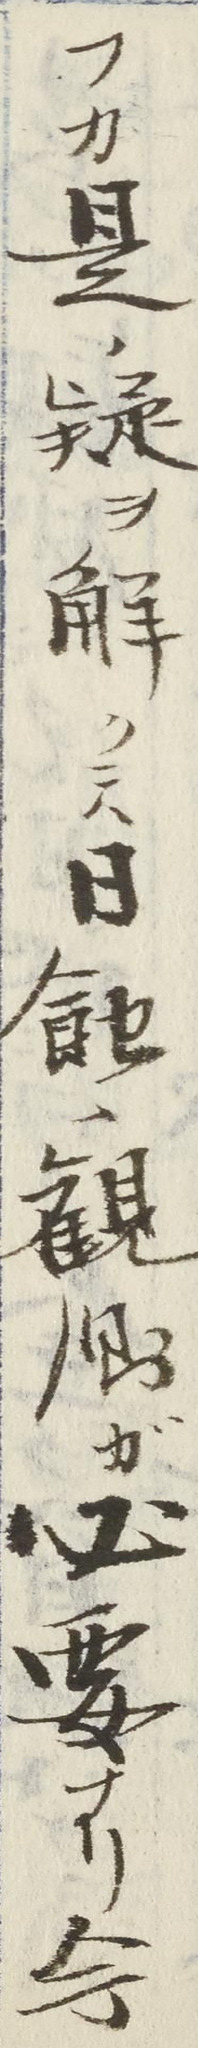フカ是ノ疑ヲ解ク二ハ日蝕ノ観測ガ必要ナリ今
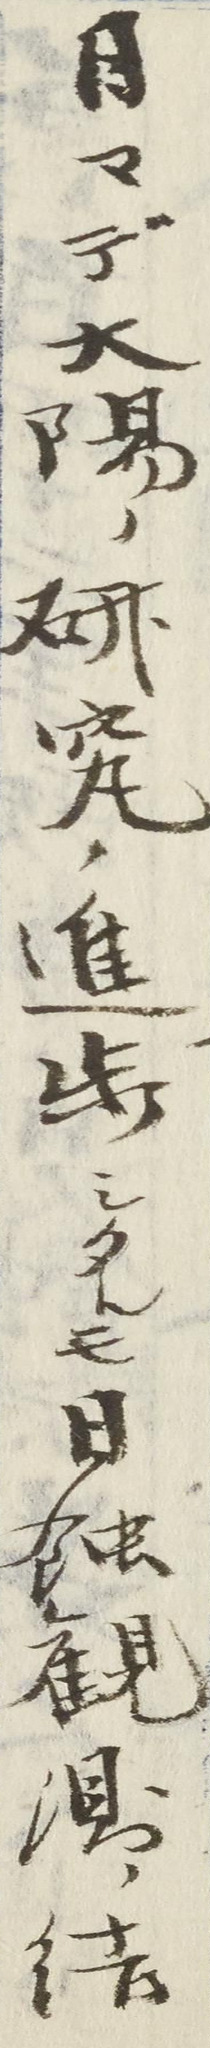日マデ太陽ノ研究ノ進歩シタㇽモ日蝕観測ノ結
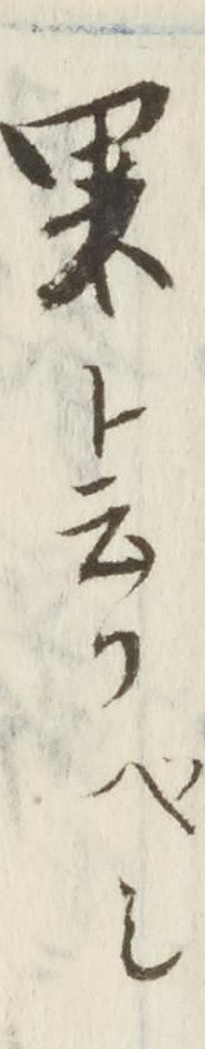果ト云フべし
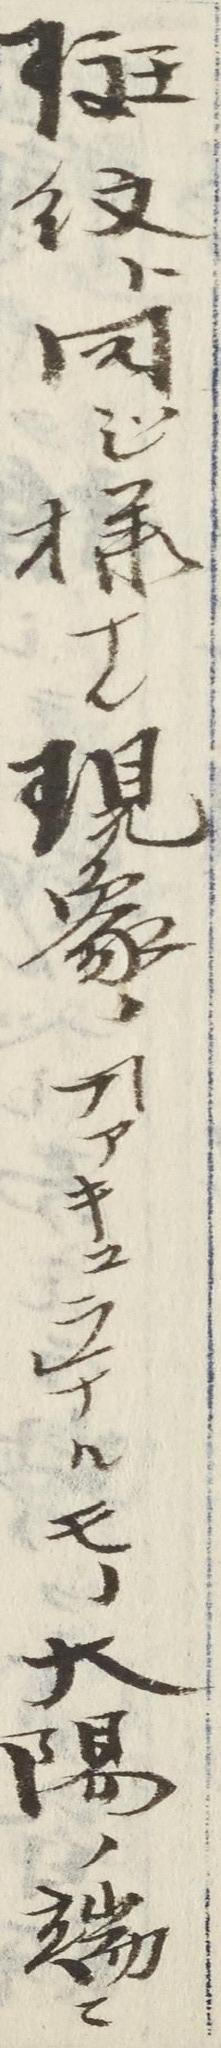斑紋ㇳ同じ様ナル現象に「フアキユラ」ナルモノ大太陽ノ端二
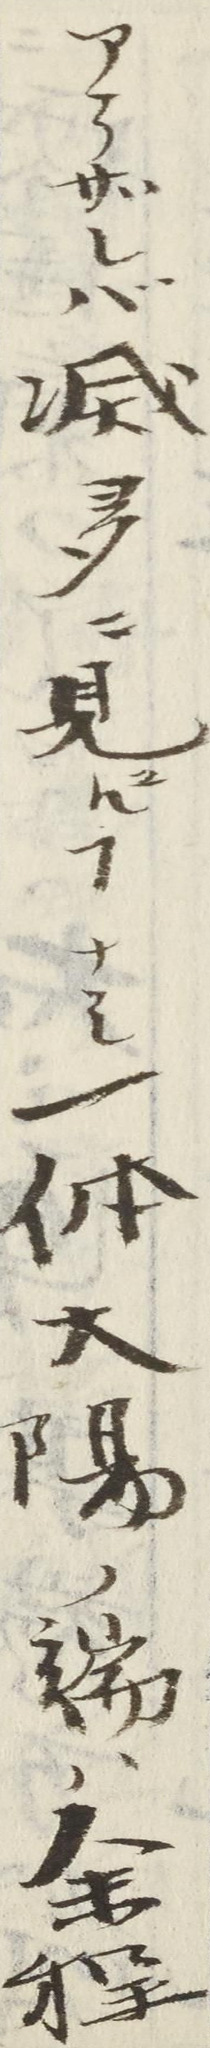アラザレバ滅多二見ユㇽコトナし一体太陽ノ端ハ余程
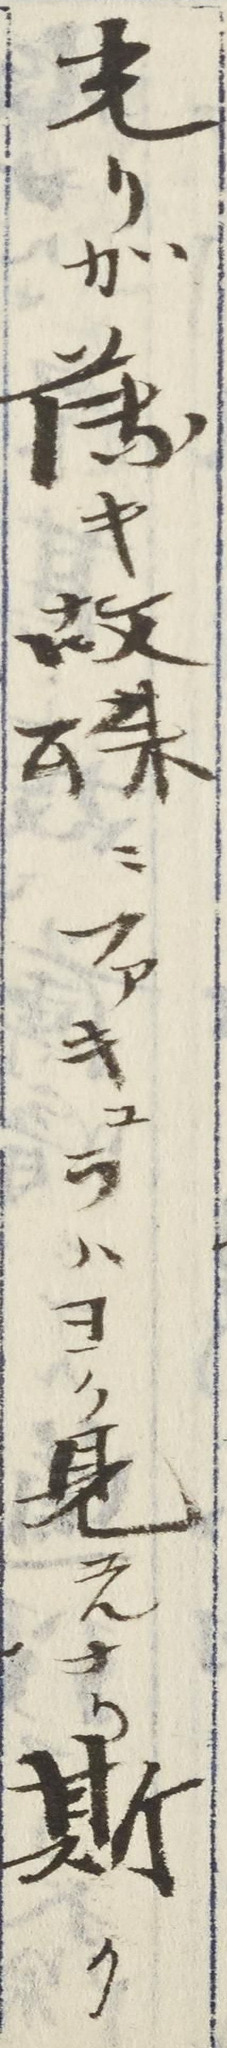光ガ薄キ故殊二フアキユラハヨク見ユんナリ斯ク
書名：日蝕録　全
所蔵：東京大学地震研究所図書室 Earthquake Research Institute Library, The University of Tokyo, JAPAN
